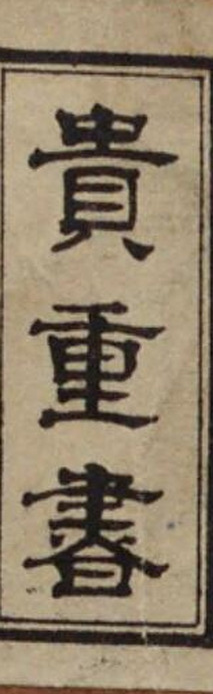貴重書
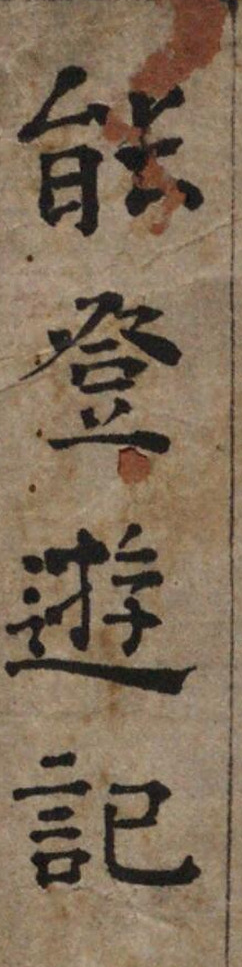能登遊記
